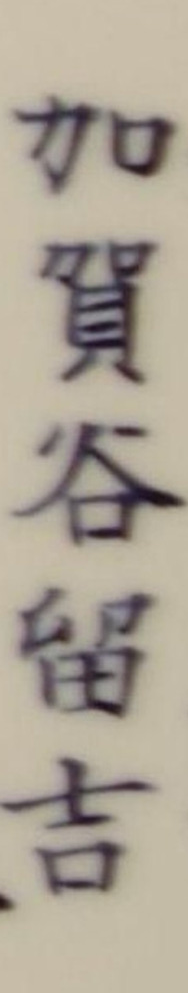加賀谷留吉
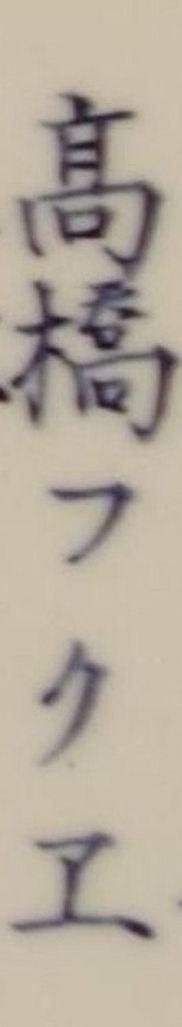高橋フクエ
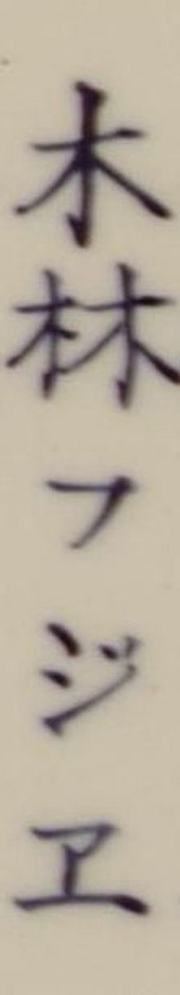木林フジヱ
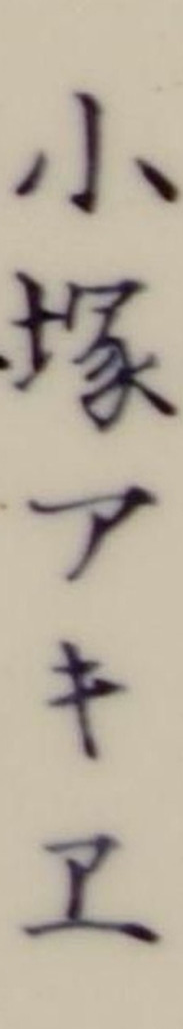小塚アキヱ
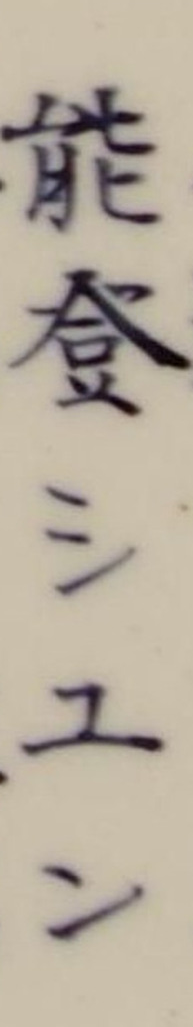能登シユン
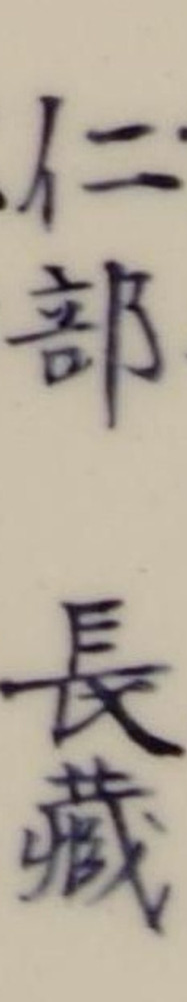仁部長蔵
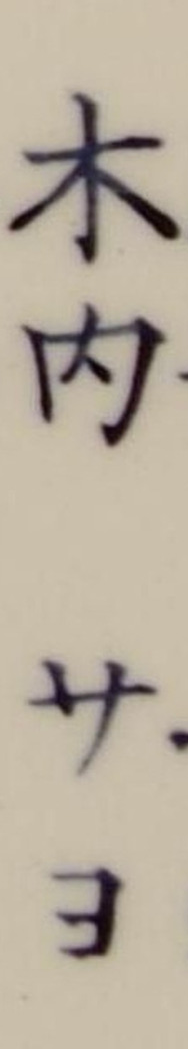木内サヨ
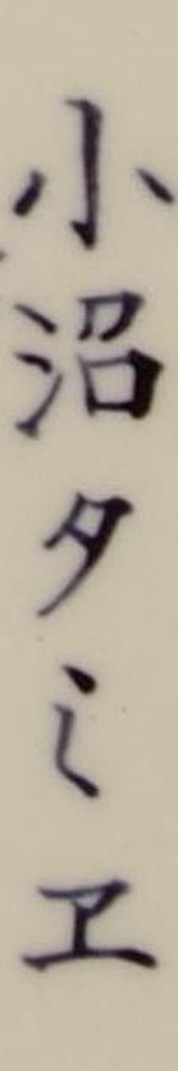小沼夕之ヱ
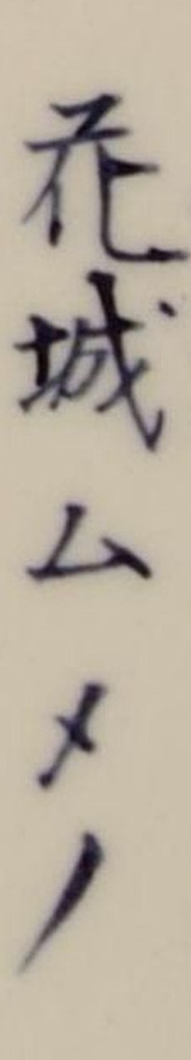花城ムメノ
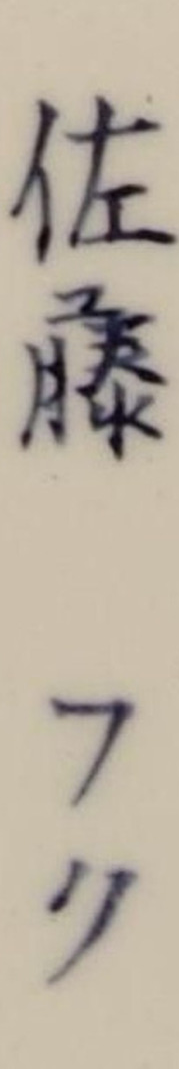佐藤フク
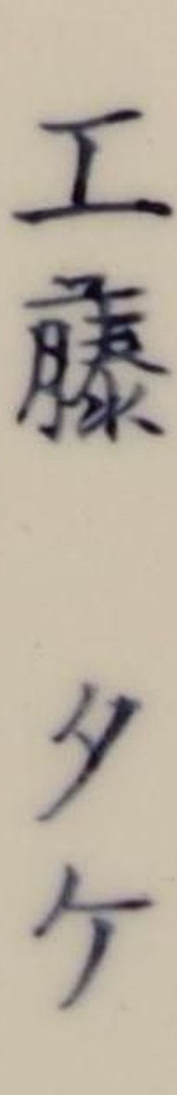工藤夕ケ
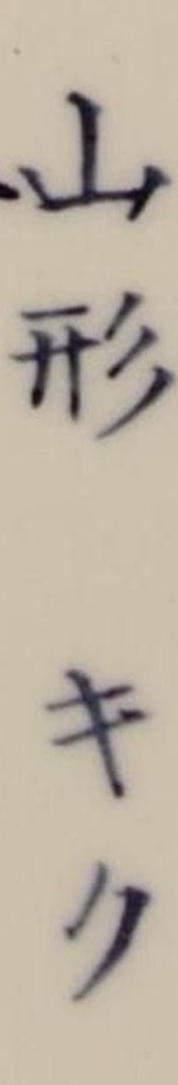山形キク
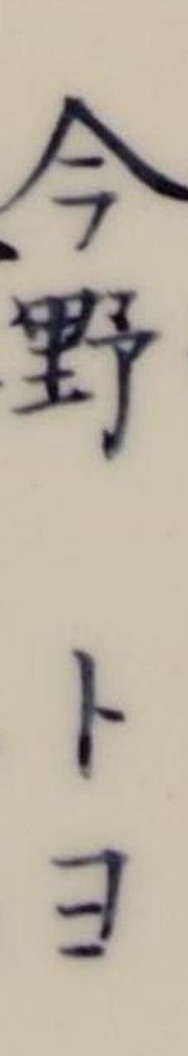今野トヨ
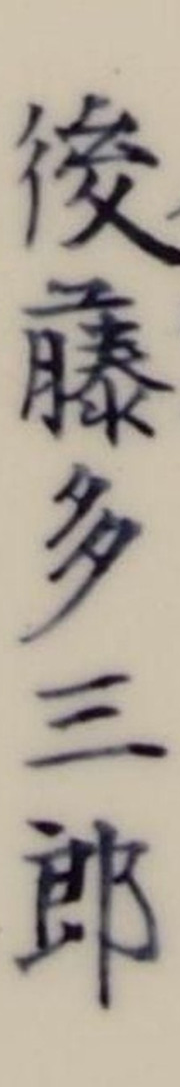後藤多三郎
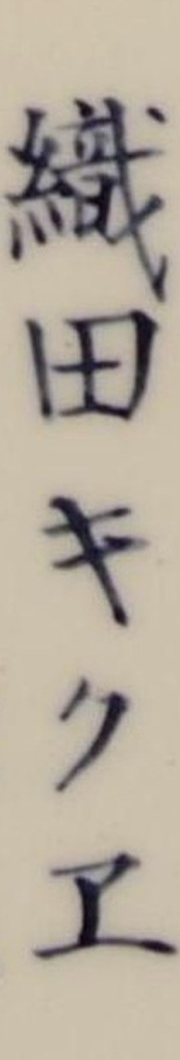織田キクヱ
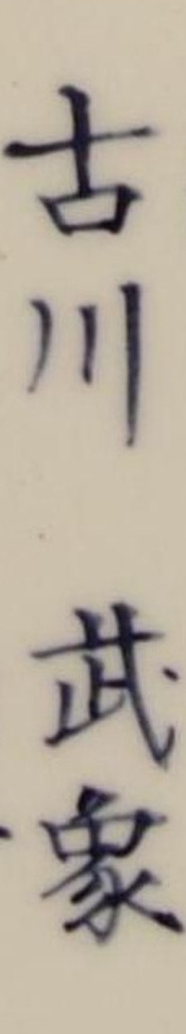古川武家
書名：E~L
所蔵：高野山金剛峯寺
